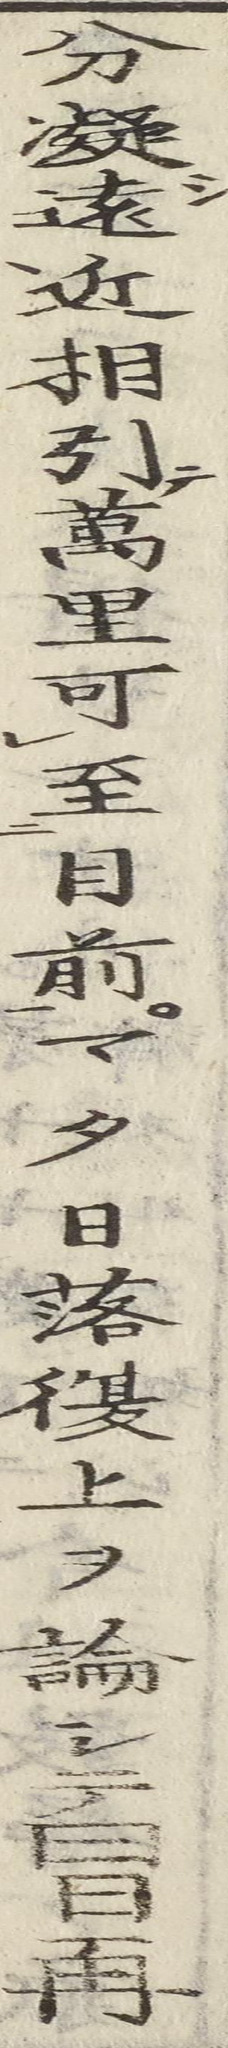分凝遠近相引万里可至ニ目前。マタ日落復上ヲ論シテ曰日再
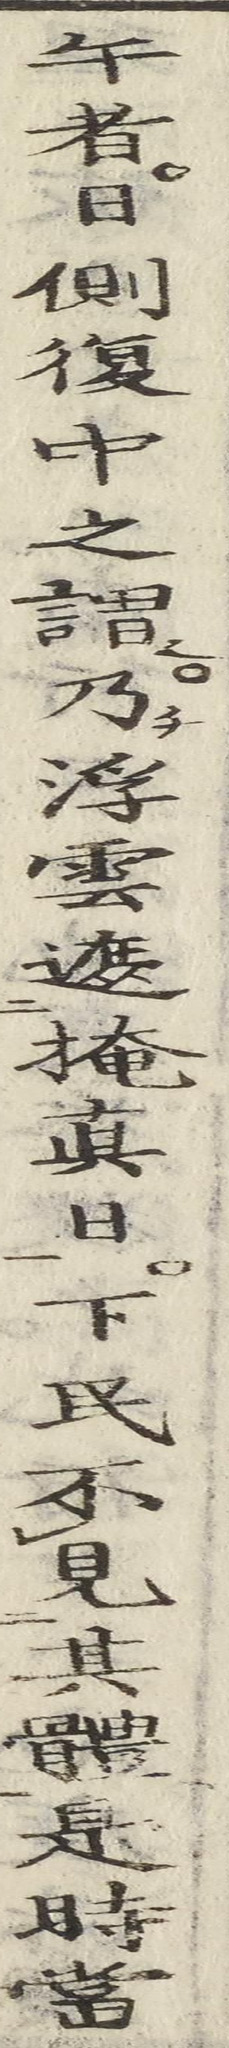午者。日側復中之謂也。乃浮雲遮ニ掩真日。下民不見ニ其体其時当
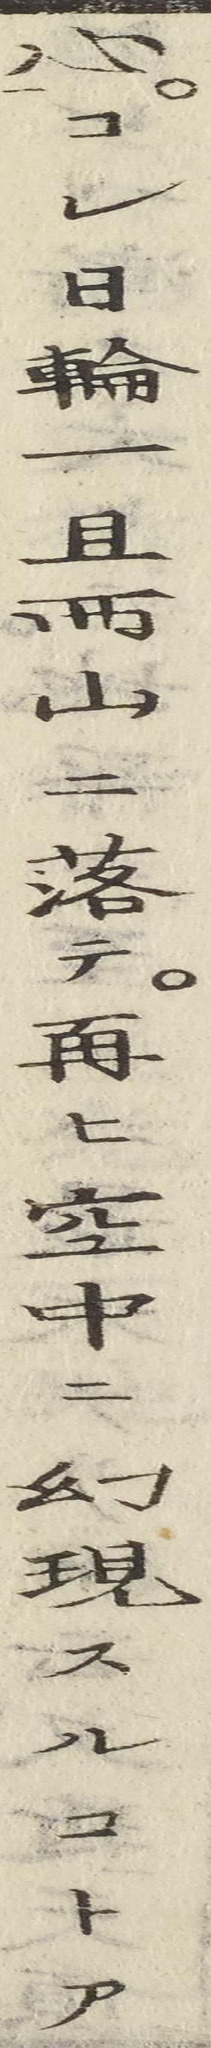心。コレ日輪一且西山ニ落テ。再ヒ空中ニ幻現スルコトア
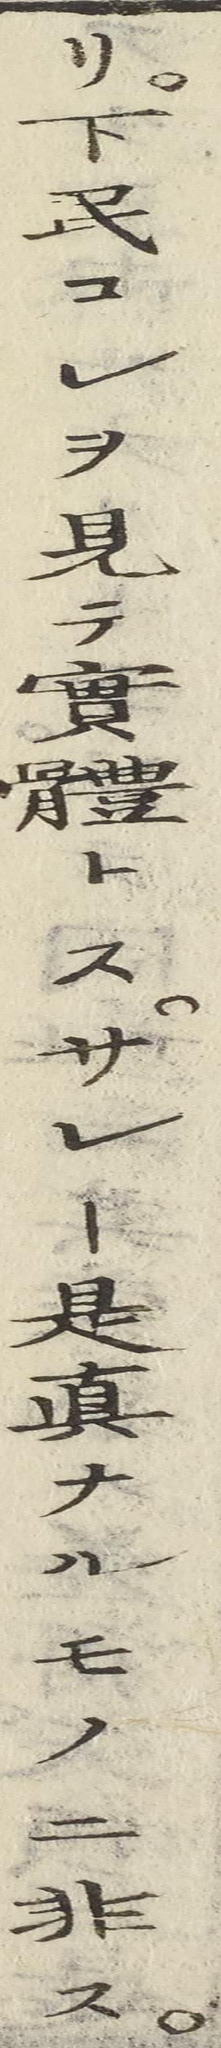リ。下民コレヲ見テ実体トス。サレト是真ナルモノニ非ス。
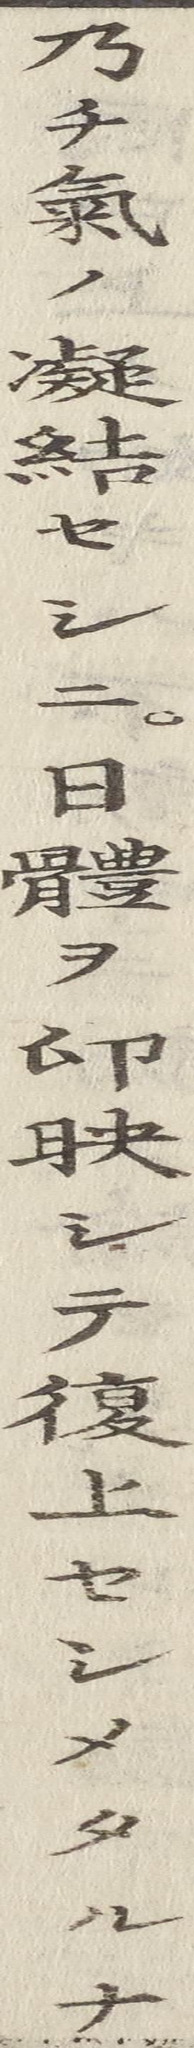乃チ気ノ凝結セシニ。日体ヲ卬映シテ復上セシメタルナ
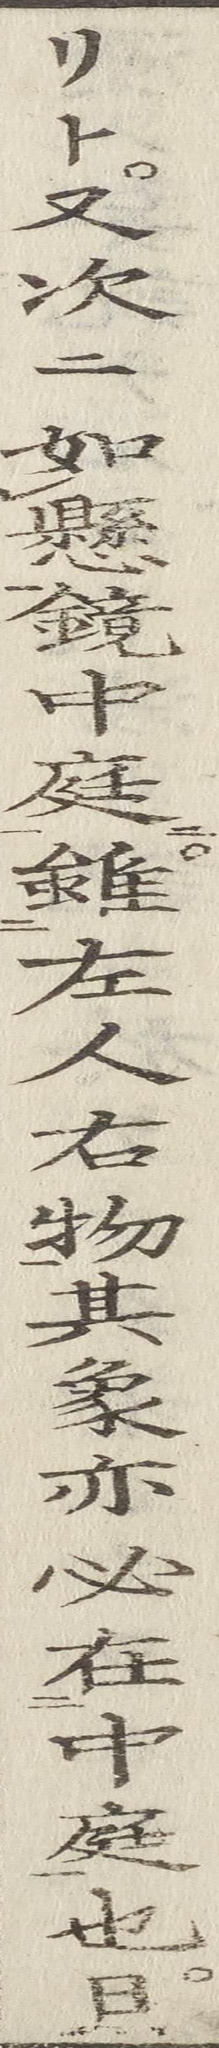リト。又次ニ如懸ニ鏡中庭。雖ニ左人右物其象亦必在ニ中庭也。日
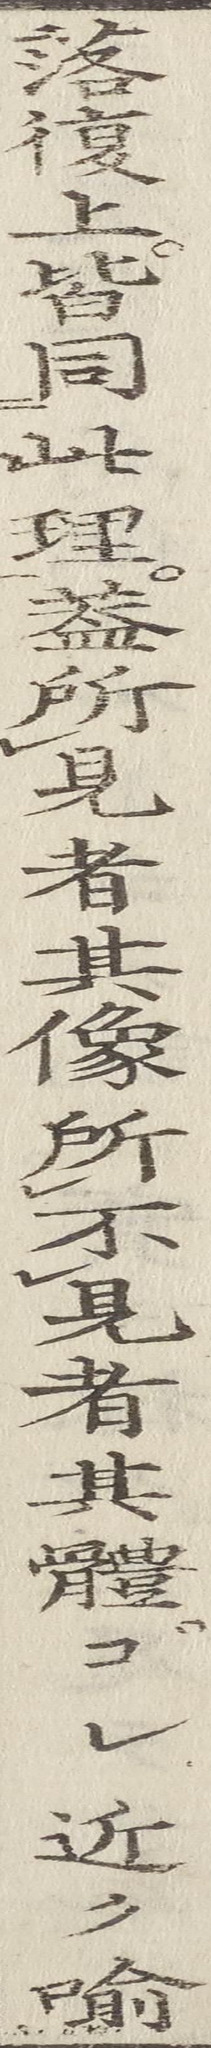落復上。皆同ニ此理。蓋所見者其像所不見者其体。コレ近ク喩
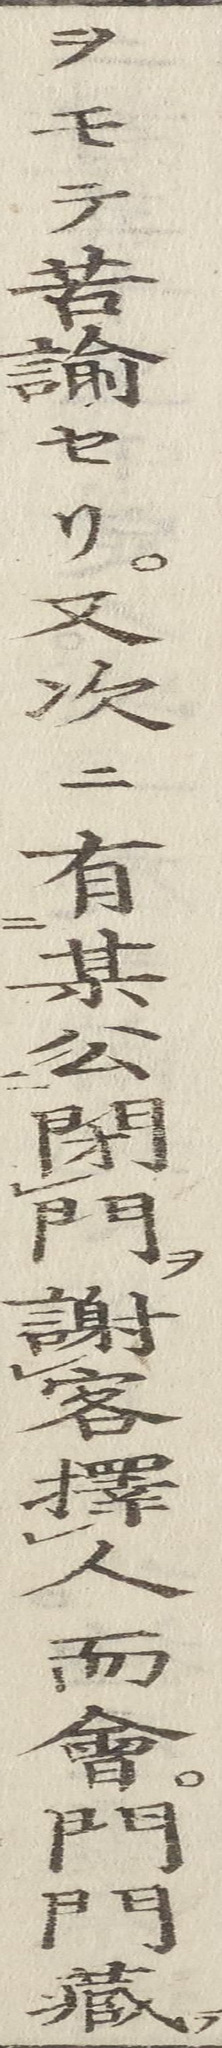ヲモテ苦論セリ。又次ニ有ニ某公閉門謝客擇人而会。門門蔵
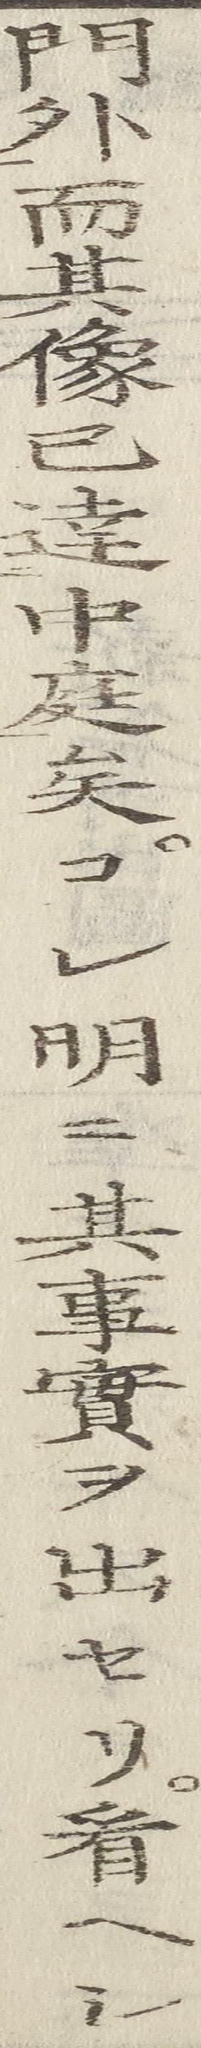門外而其像已達ニ中庭矣。コレ明ニ其事実ヲ出セリ。看ヘシ
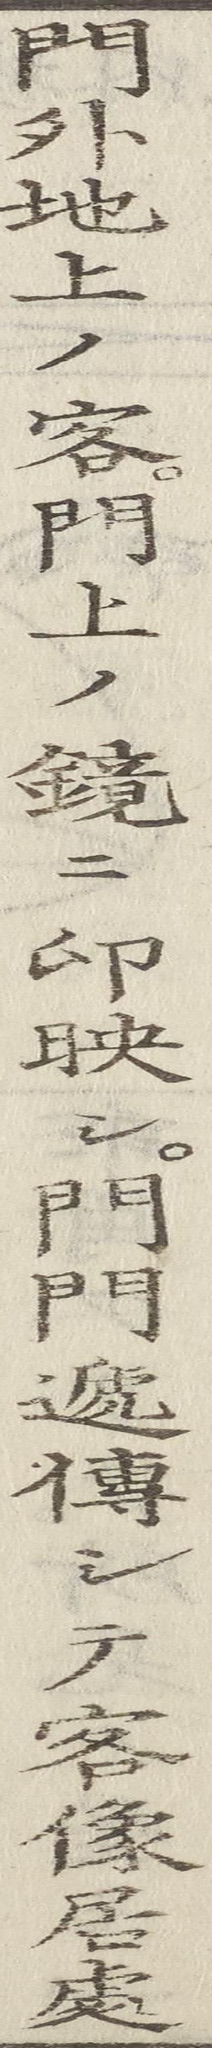門外地上ノ客。門上ノ鏡ニ卬映シ。門門逓傅シテ客像居処
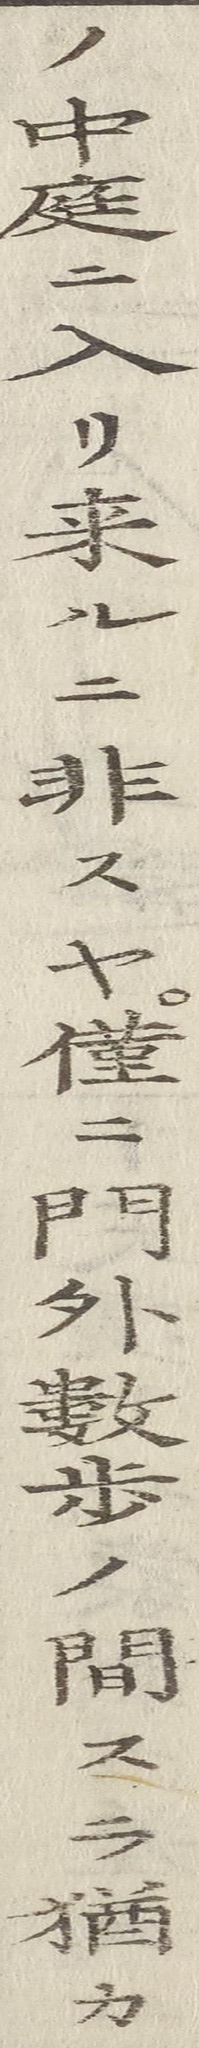ノ中庭ニ入リ来ルニ非スヤ。僅ニ門外数歩ノ間スラ猶カ
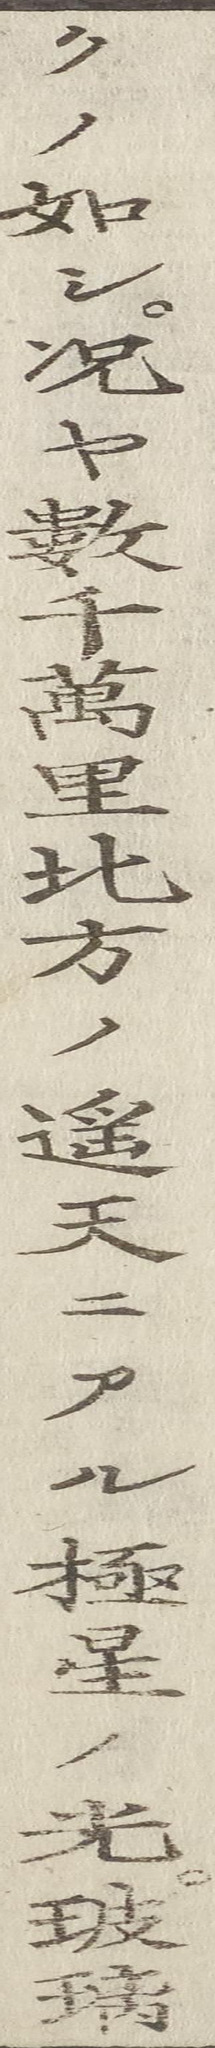クノ如シ。況ヤ数千万里北方ノ遥天ニアル極星ノ光。玻璃
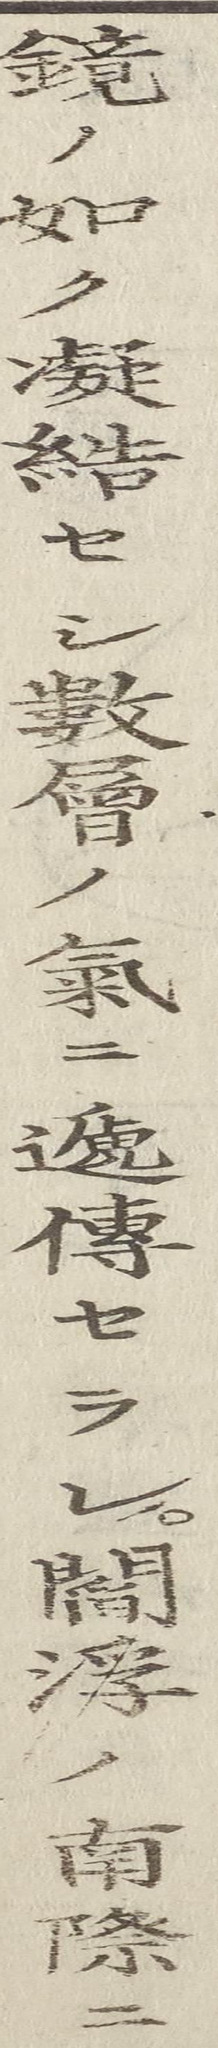鏡ノ如ク凝結セシ数層ノ気ニ逓傅セラレ。閻浮ノ南際ニ

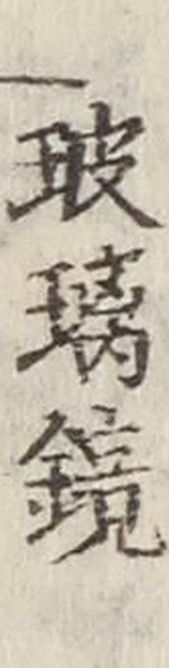玻璃鏡
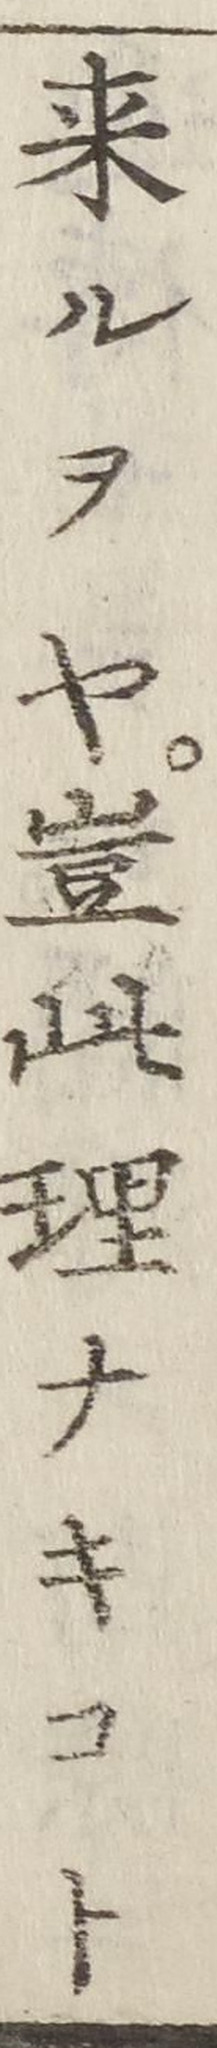来ルヲヤ。豈此理ナキコト
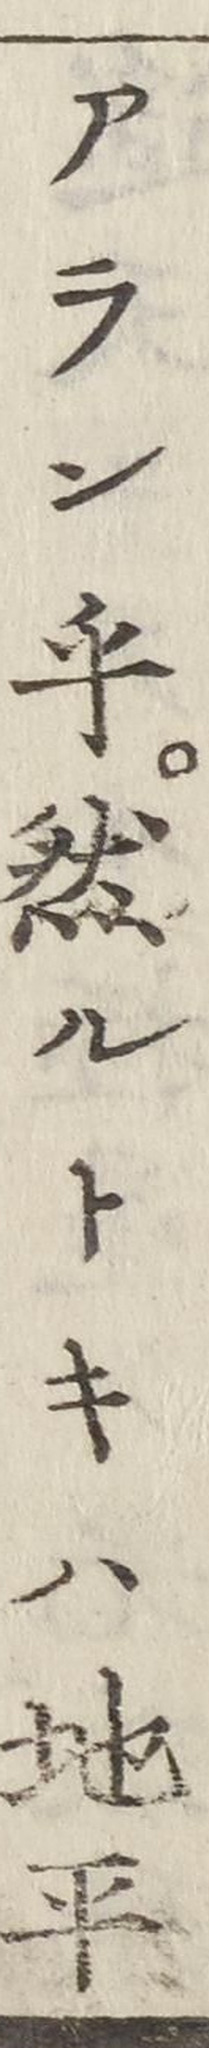アラン乎。然トキハ地平
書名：護法新論　二編　中
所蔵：東京大学地震研究所図書室 Earthquake Research Institute Library, The University of Tokyo, JAPAN
